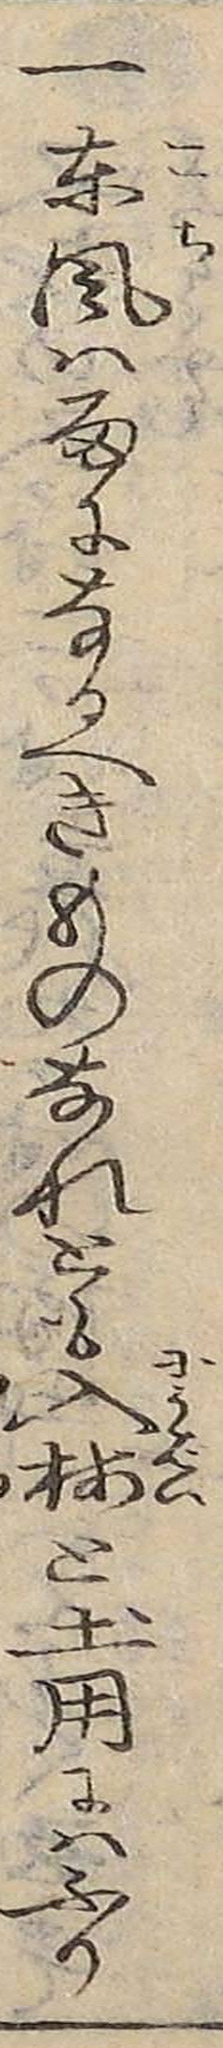一東風は雨になるへきものなれとも入梅と土用にはふり
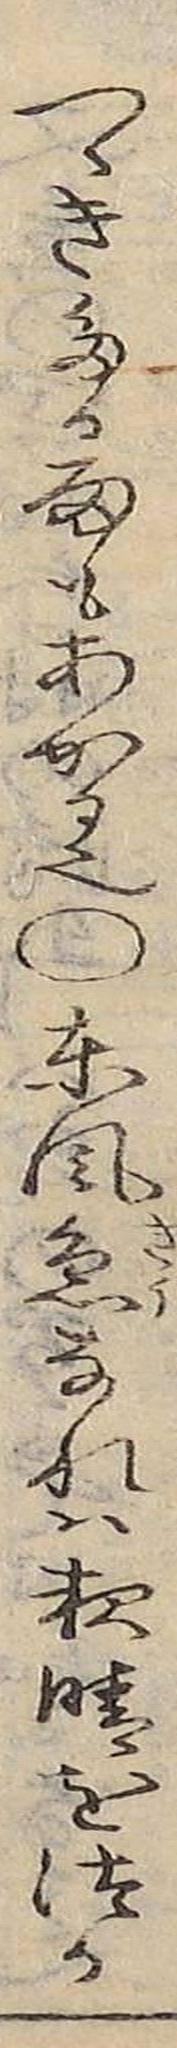つゝきたる雨もあかる也○東風急なれは夜晴をつか
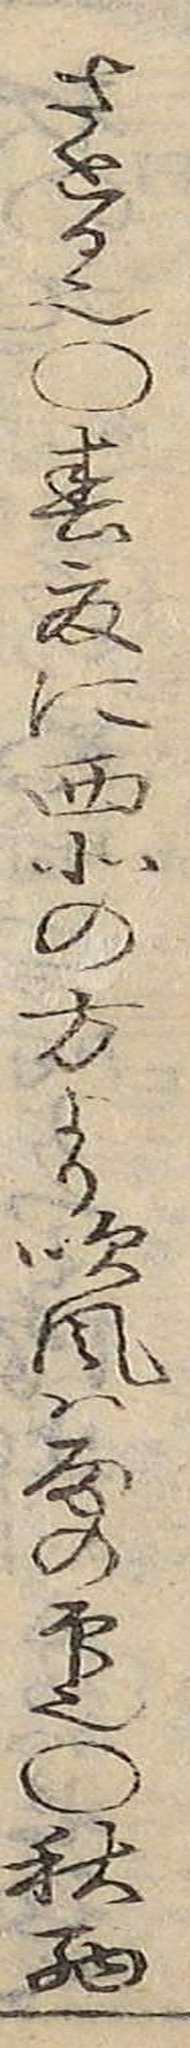さとる也○春夏に西北の方より吹風は雨の印也○秋西
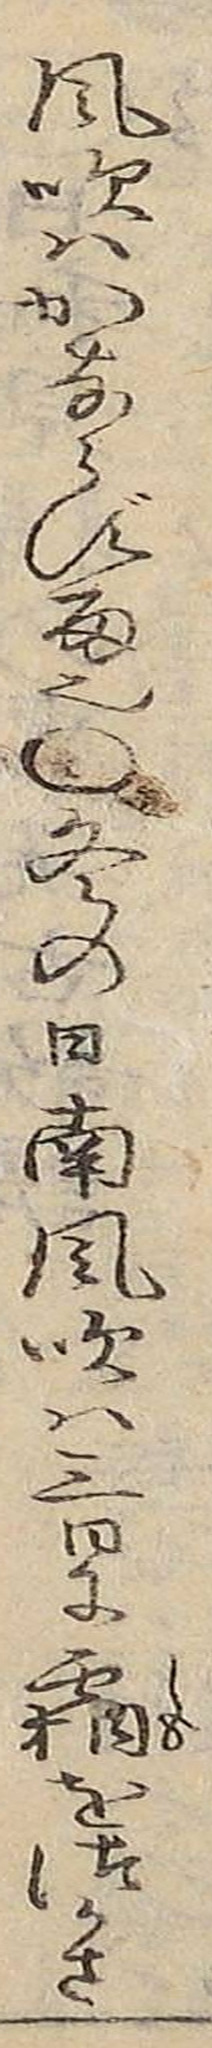風吹はかならず雨也○冬の日南風吹は三日に霜をつかさ
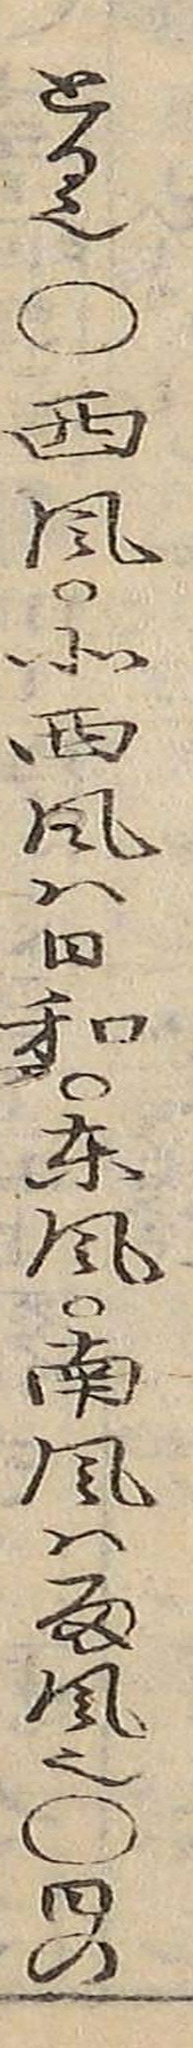とる也○西風・北西風は日和・東風・南風は雨風也○日の
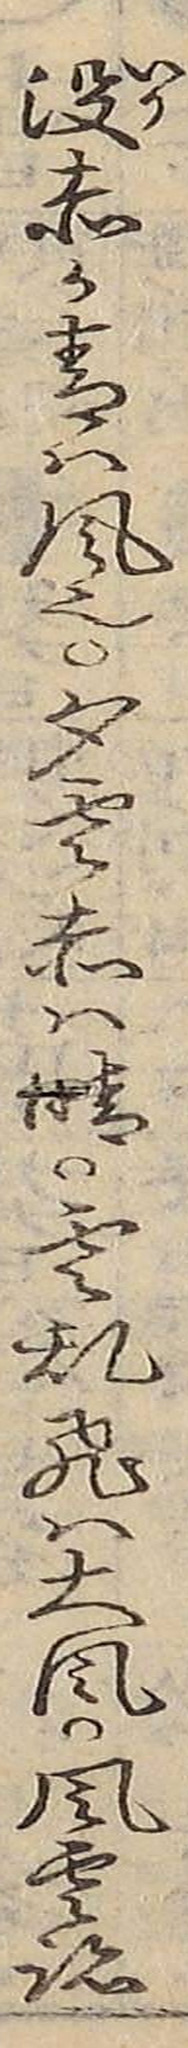没赤か青は風也・夕雲赤は晴・雲乱飛は大風・風雲跡
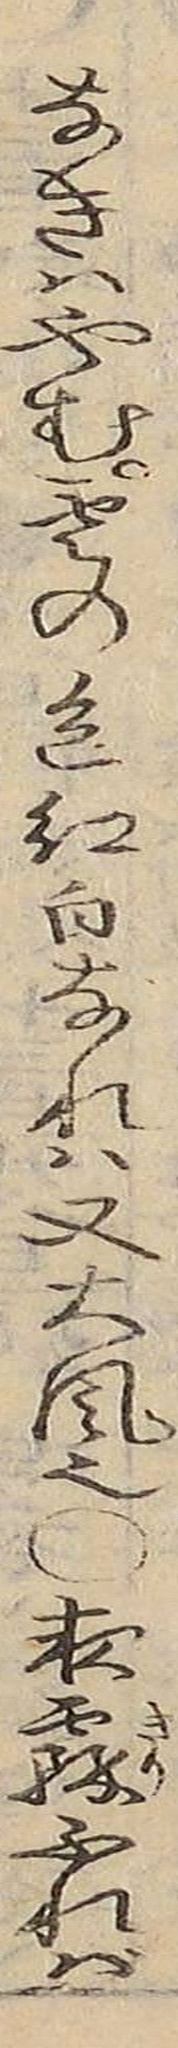なきはやむ・雲の色紅白なれは又大風也○夜霧ふれば
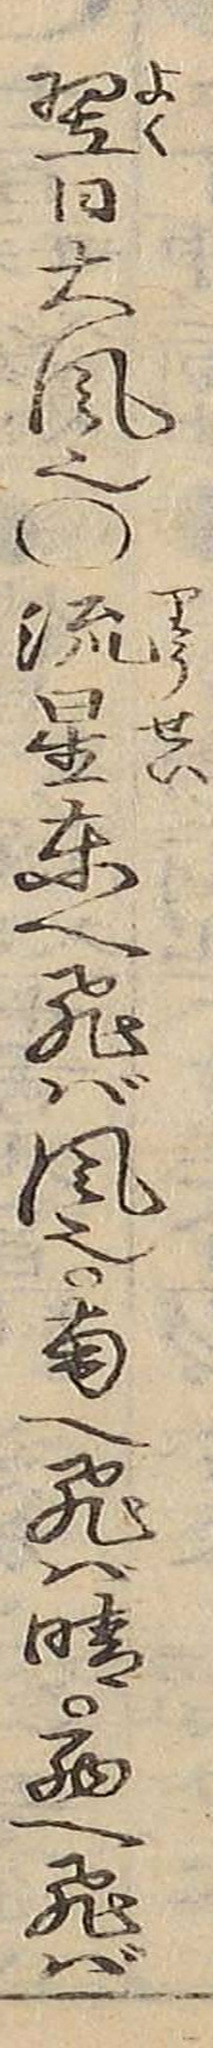翌日大風也○流星東へ飛ば風也・南へ飛ば晴・西へ飛ば
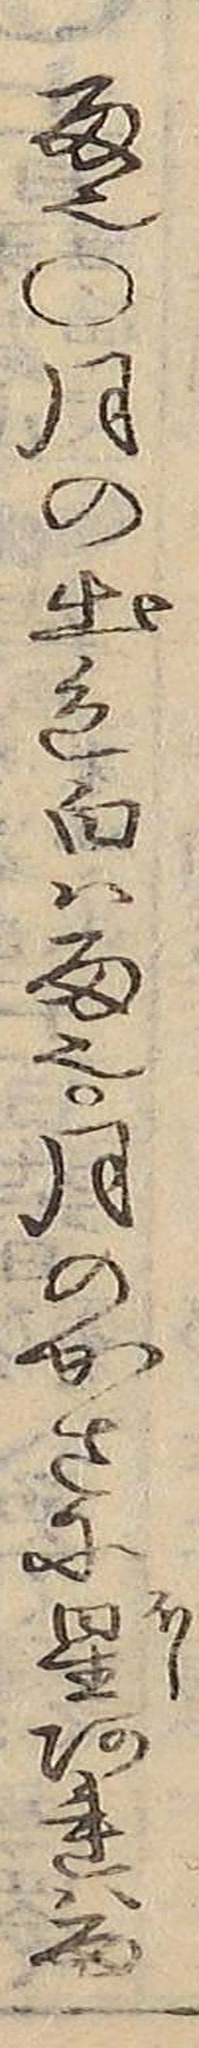雨也○月の出色白は雨也・月のかさに星あれは雨
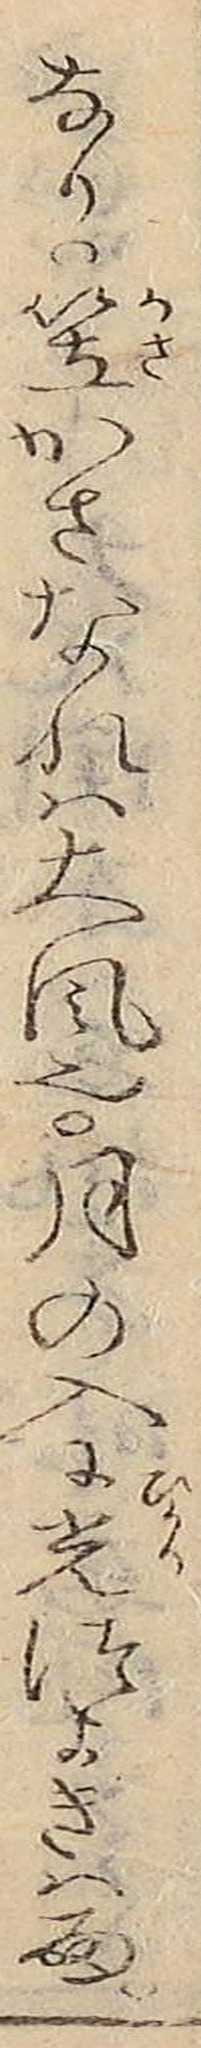なり・笠かさなれは大風也・月の入に光つよきは雨・
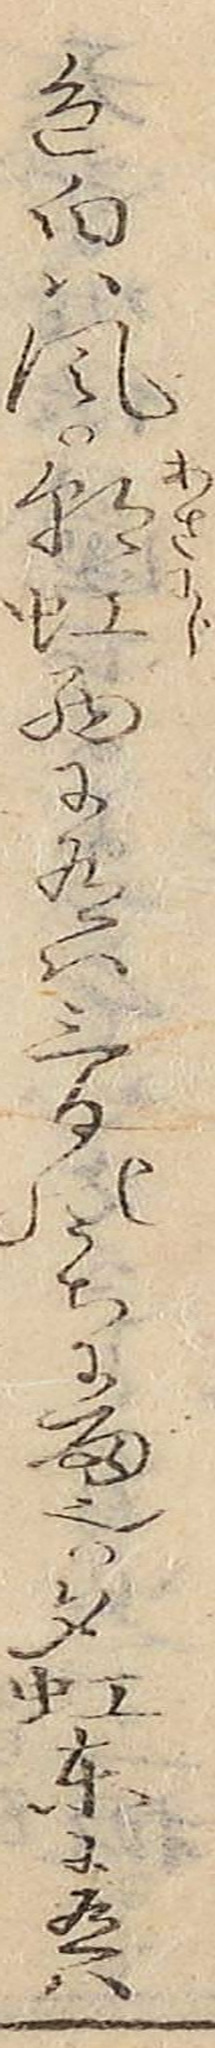色白は風・朝虹西に有は三日のうちに雨也・夕虹東に有は
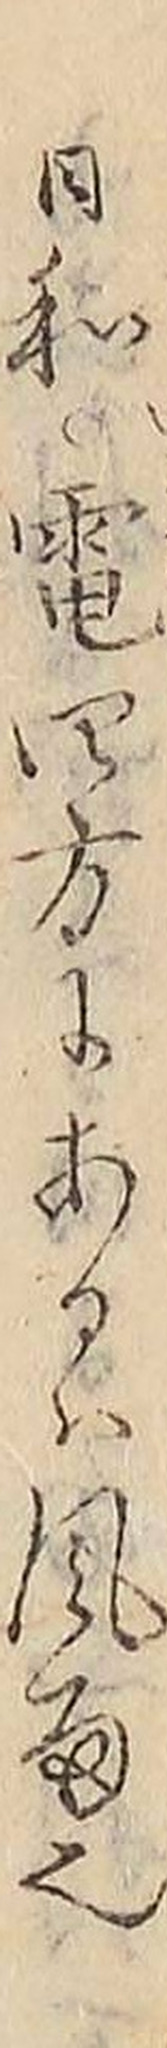日和・電四方にあるは風雨也
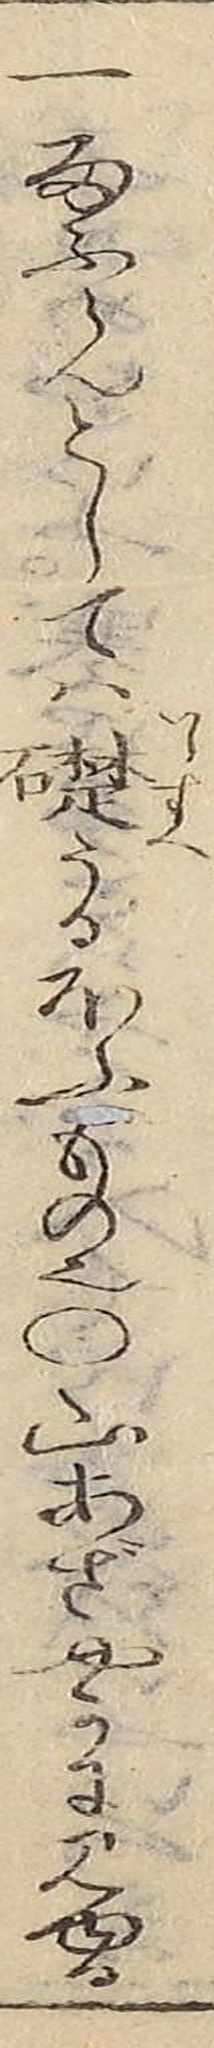一雨ふらんとしては礎うるほふもの也○山あざやかに見ゆる
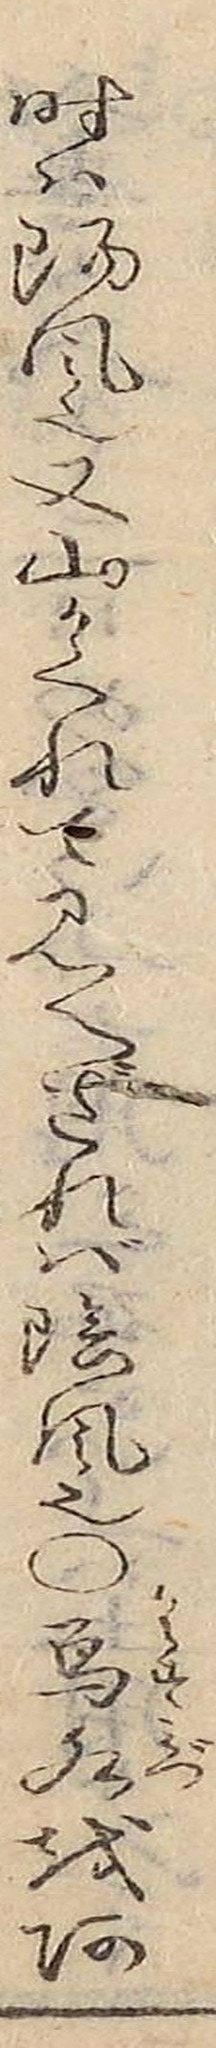時は陽風也又山かくれて見へざれば陰風也○烏水をあ
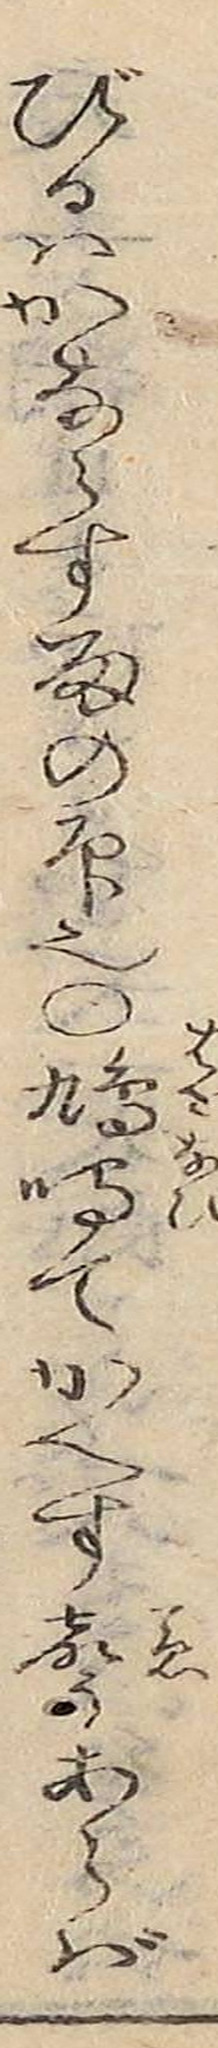びるはかならす雨の印也○鳩鳴てかへす声あらば
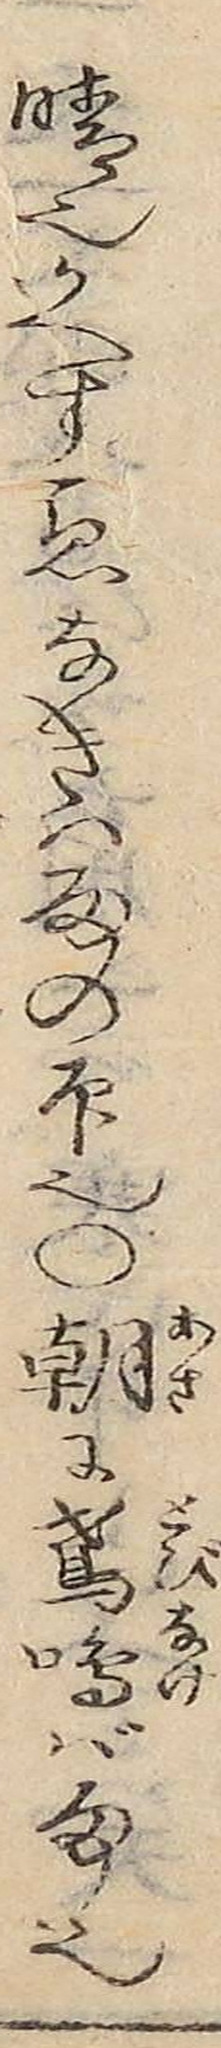晴也かへすこゑなきは雨の印也○朝に鳶鳴ば雨也
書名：旅行用心集
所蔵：神戸大学附属図書館 国文学研究資料館
